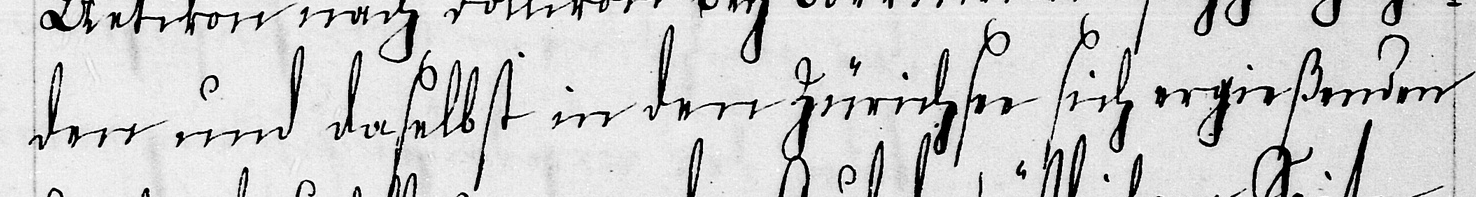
den und daselbst in den Zürichsee sich ergießenden
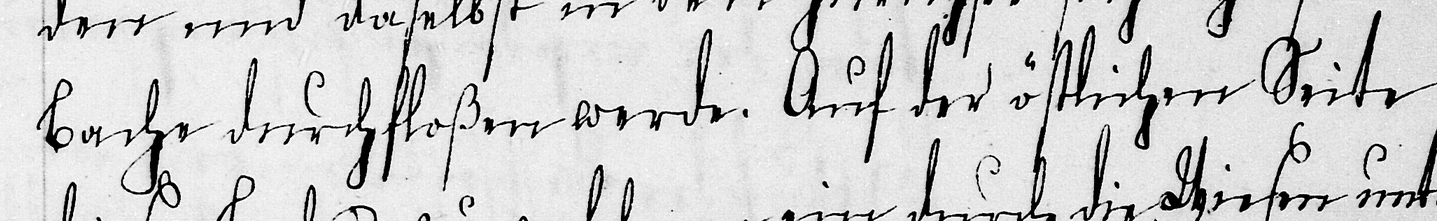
Bache durchfloßen werde. Auf der südlichen Seite
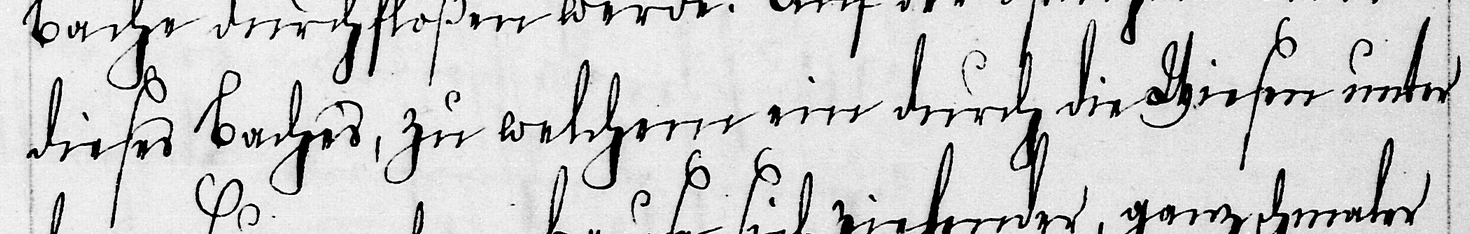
dieses Baches, zu welchem ein durch die Wiesen unter
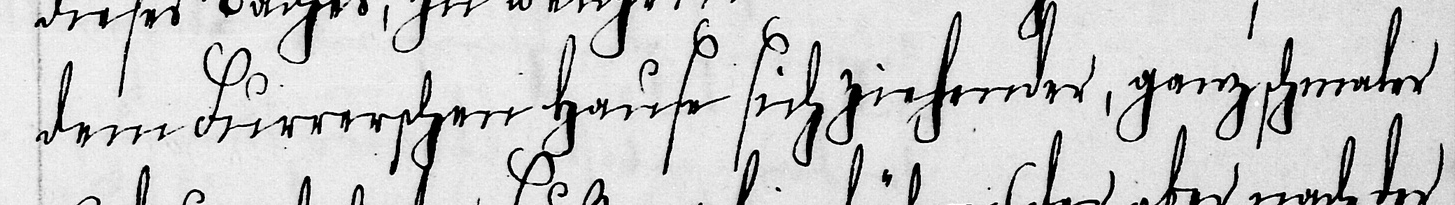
dem Furrereschen Hause sich ziehender, ganz schmaler
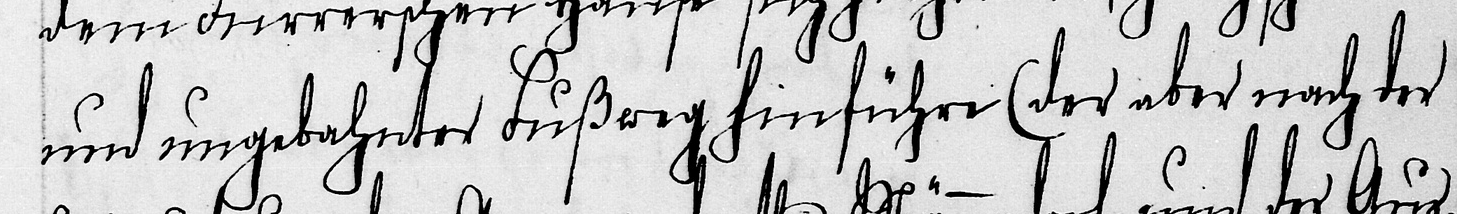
und ungebahnter Fußweg hinführe (der aber nach der
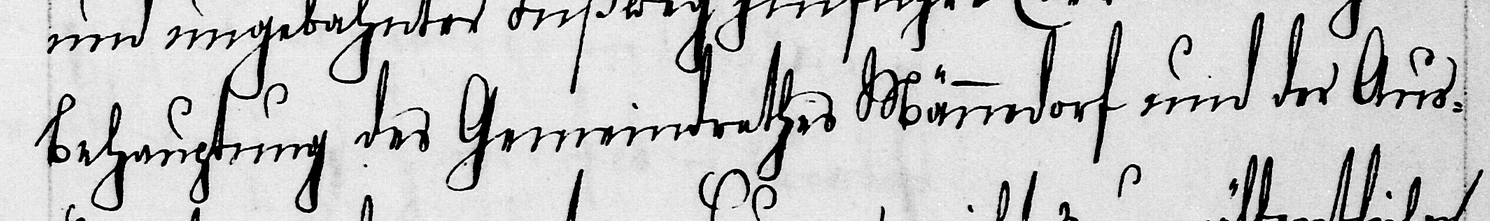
Behauptung des Gemeindrathes Männedorf und der Aus¬
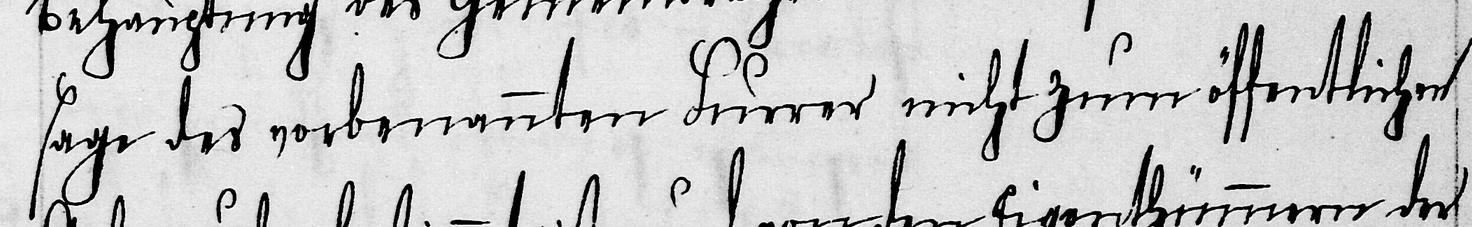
sage des vorbenannten Furrer nicht zum öffentlichen
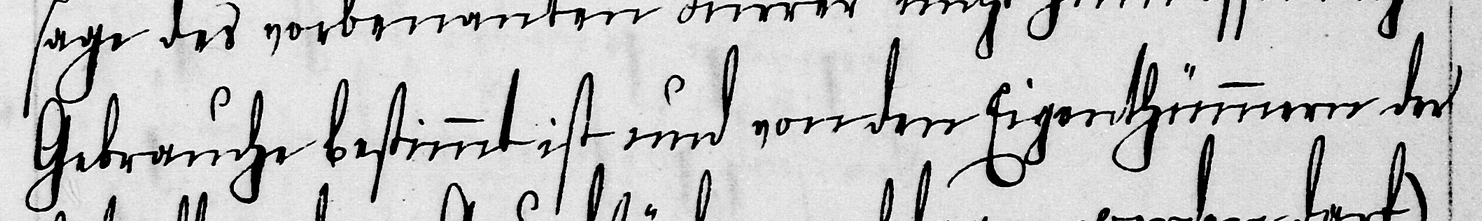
Gebrauche bestimmt ist und von den Eigenthümmern der
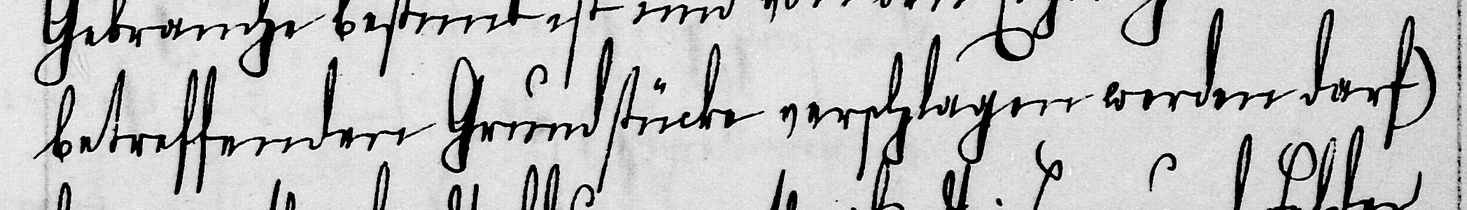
betreffenden Grundstücke verschlagen werden darf)
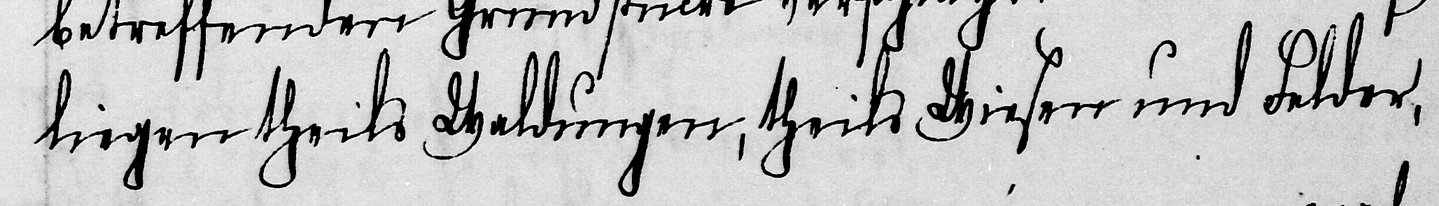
liegen theils Waldungen, theils Wiesen und Felder,
